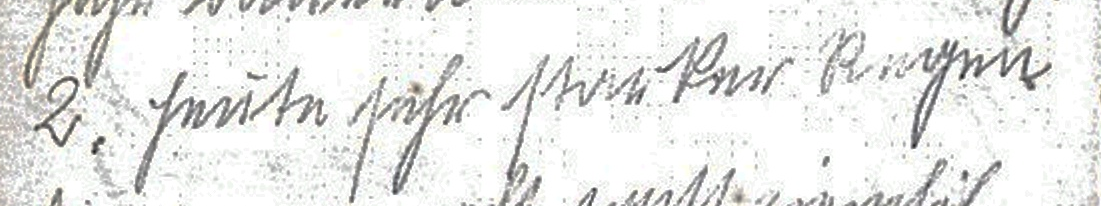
2. heute sehr starker Regen
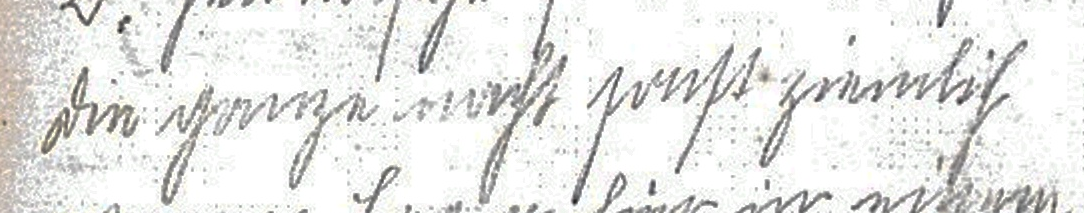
die ganze nacht sonst ziemlich
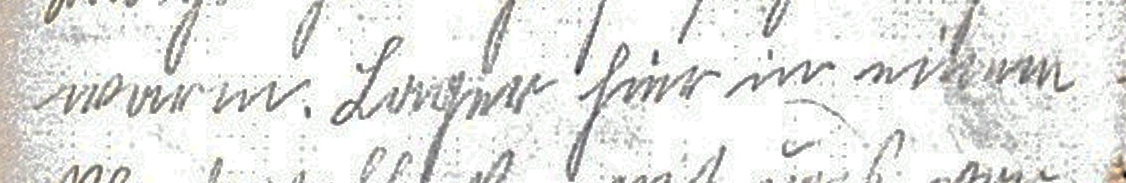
warm. Lager hier in einem
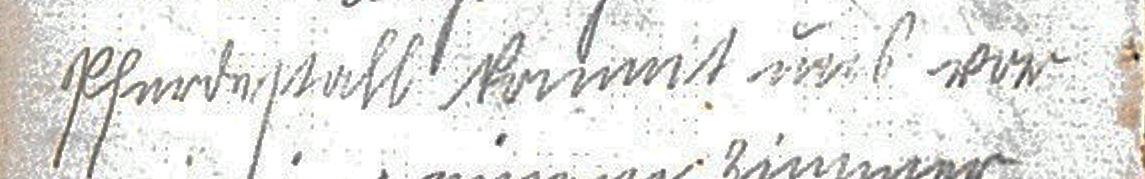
Pferdestall kommt uns vor
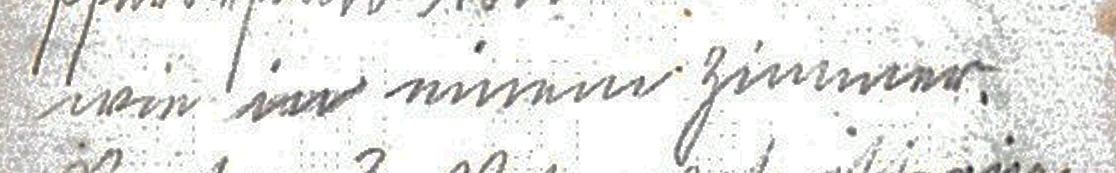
wie in einem Zimmer.
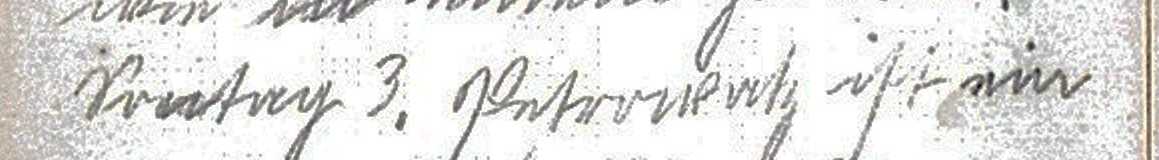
Sonntag 3. Petrovatz ist ein
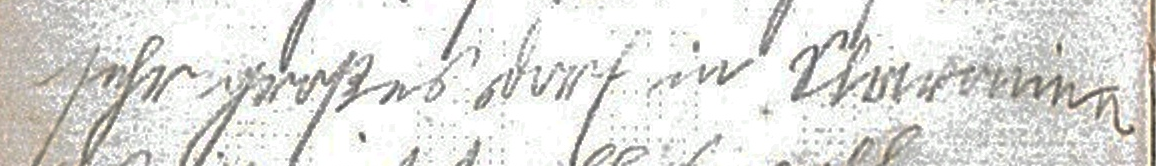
sehr großes Dorf in Serbien
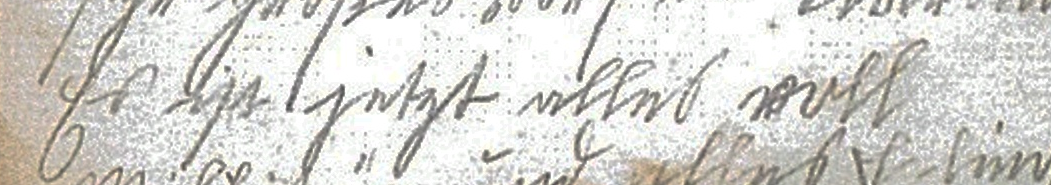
Es ist jetzt alles voll
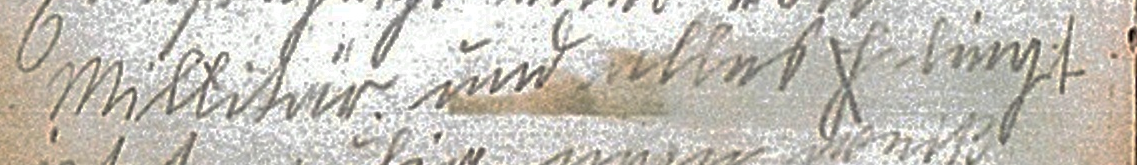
Millitär und alles liegt
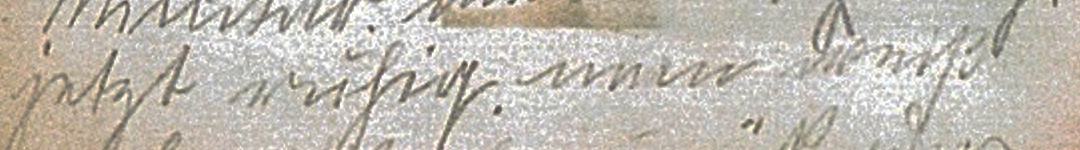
jetzt ruhig man weiß
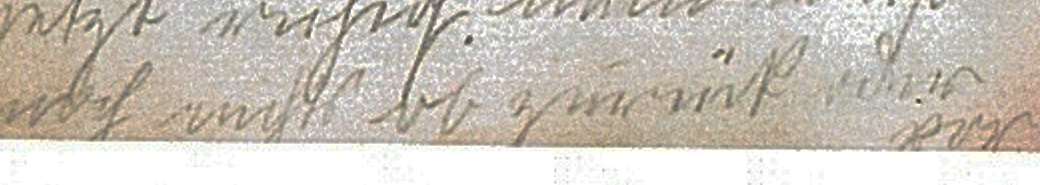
noch nichts ob zurück oder
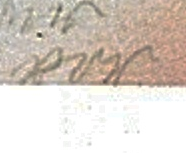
vor.
